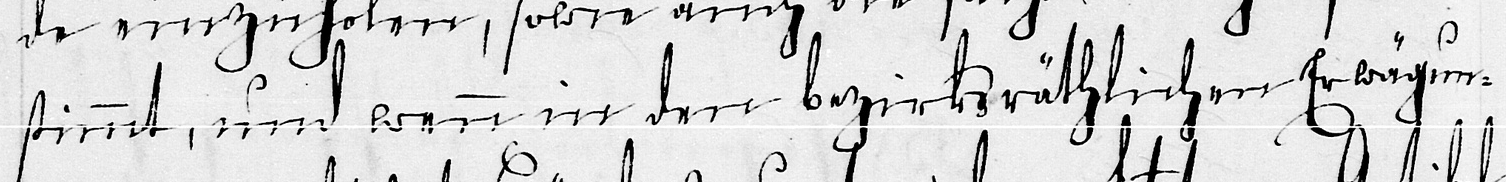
stimmt, und wenn in den bezirksräthlichen Erwägun¬
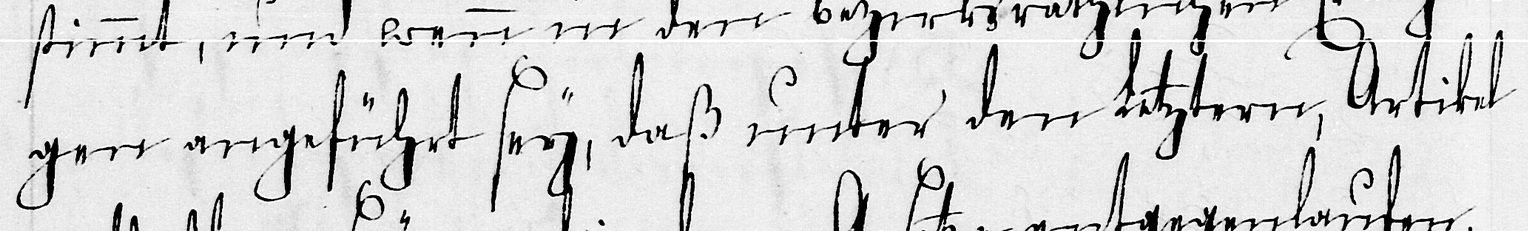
gen angeführt sey, daß unter den Letztern, Artikel
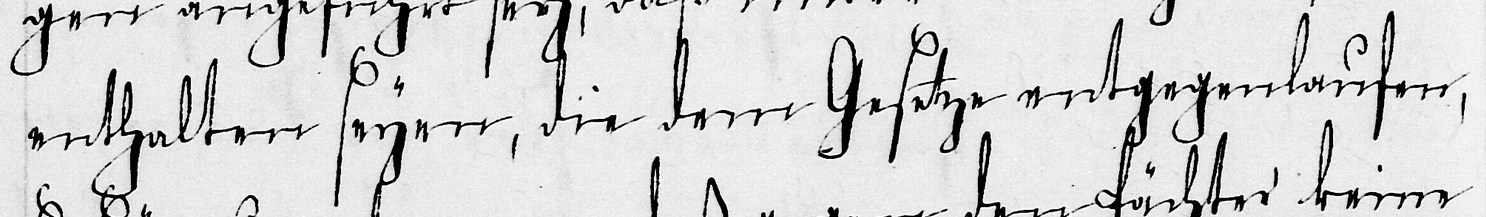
enthalten seyen, die dem Gesetze entgegenlaufen,
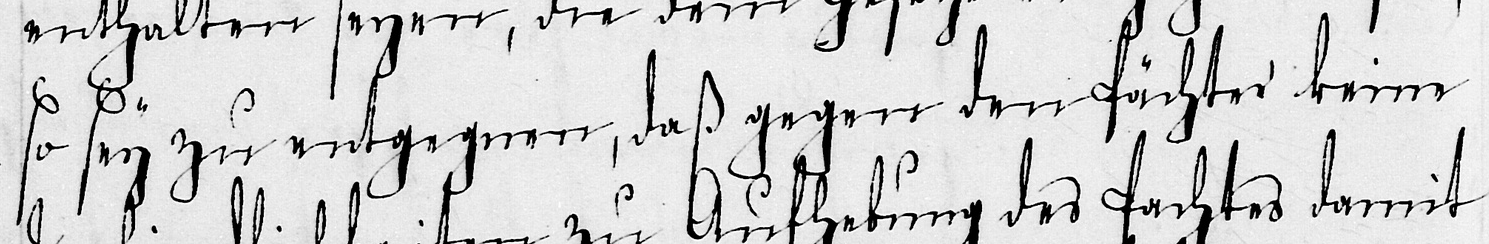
so sey zu entgegnen, daß gegen den Pächter keine
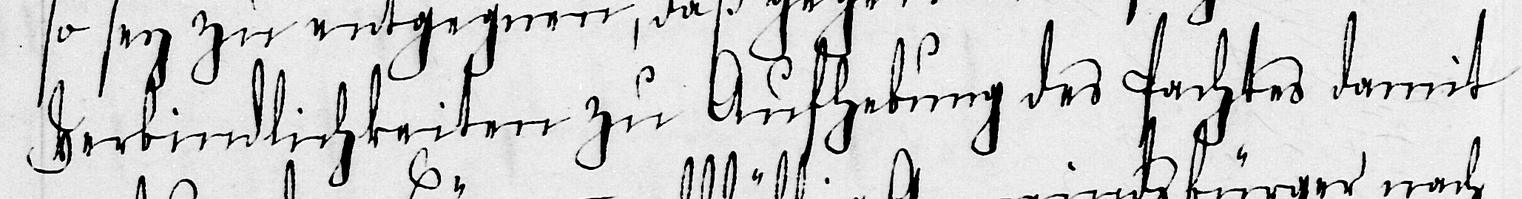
Verbindlichkeiten zu Aufhebung des Pachtes damit
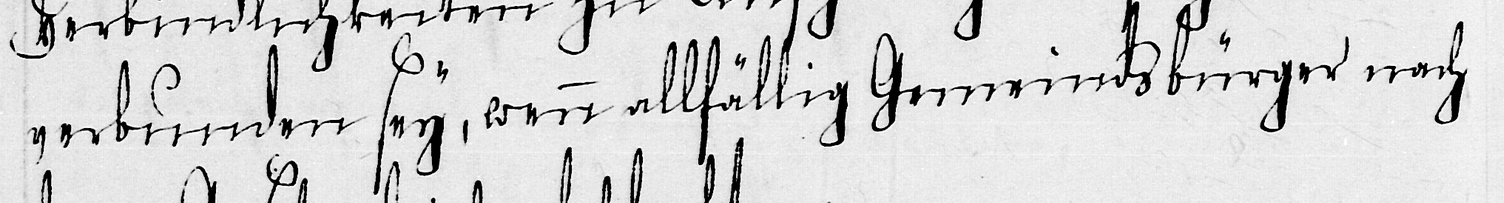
verbunden sey, wenn allfällig Gemeindsbürger nach
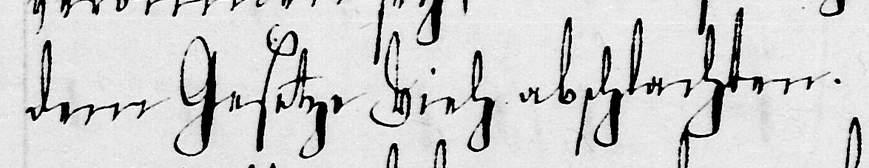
dem Gesetze Vieh abschlachten.
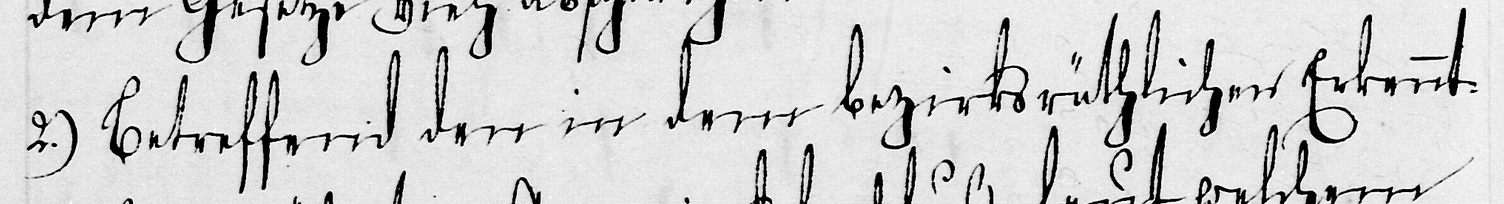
2.) Betreffend den in dem bezirksräthlichen Erkennt¬
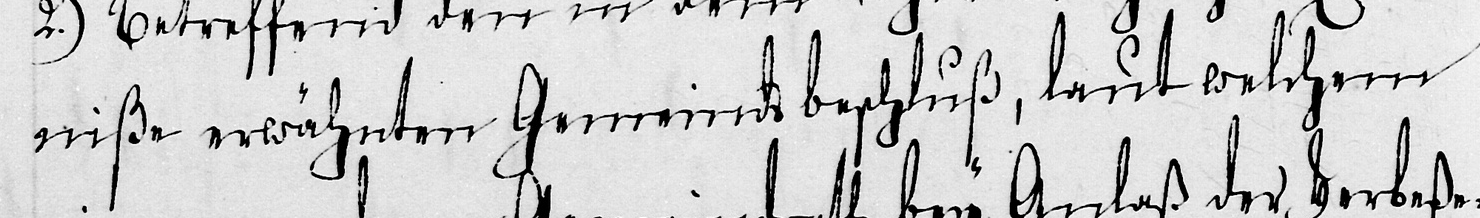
niße erwähnten Gemeindsbeschluß, laut welchem
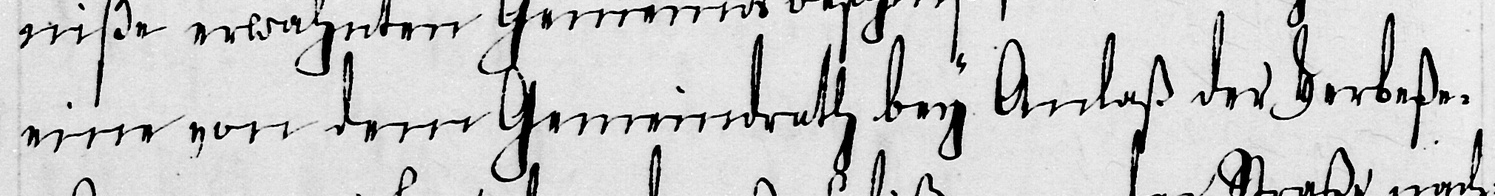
eine von dem Gemeindrath bey Anlaß der Verbeße¬
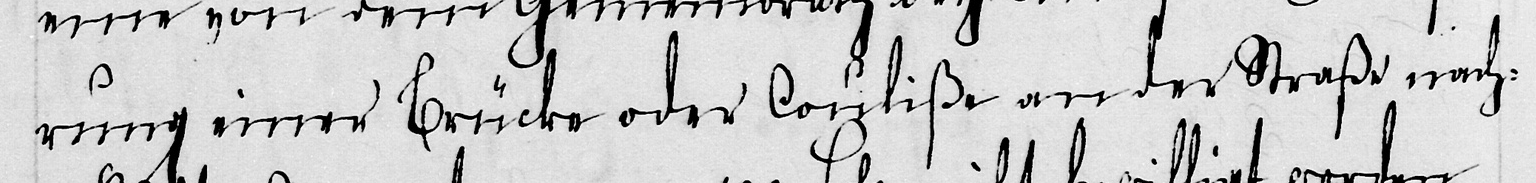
rung einer Brücke oder Couliße an der Straße nach¬
